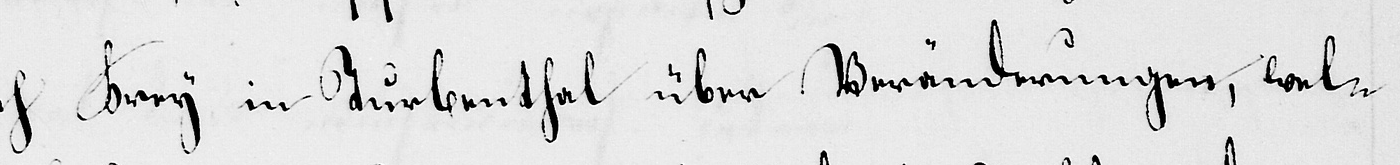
Frey in Turbenthal über Veränderungen, wel¬
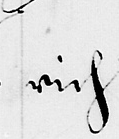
rich
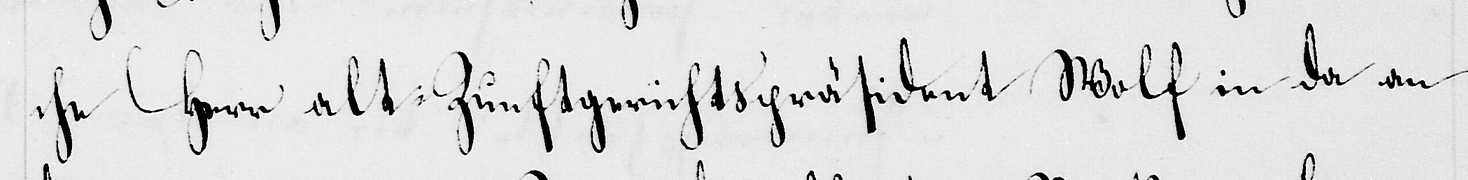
che Herr alt-Zunftgerichtspräsident Wolf in da an
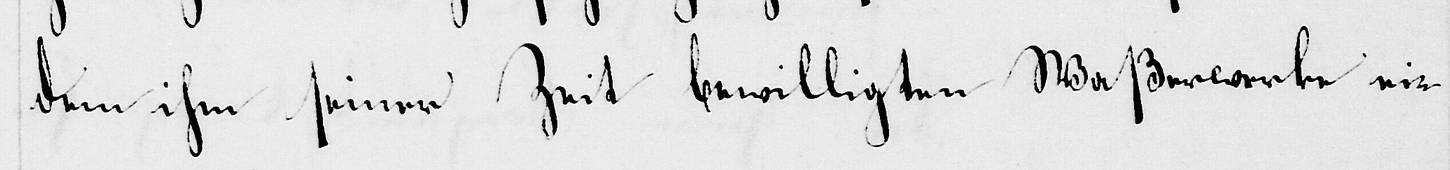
dem ihm seiner Zeit bewilligten Waßerwerke ei¬
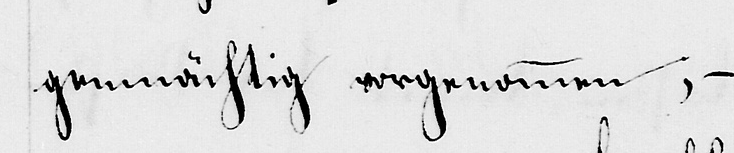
genmächtig vorgenommen,
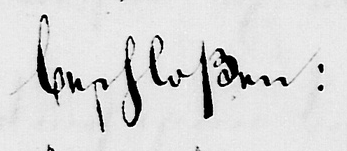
beschloßen:
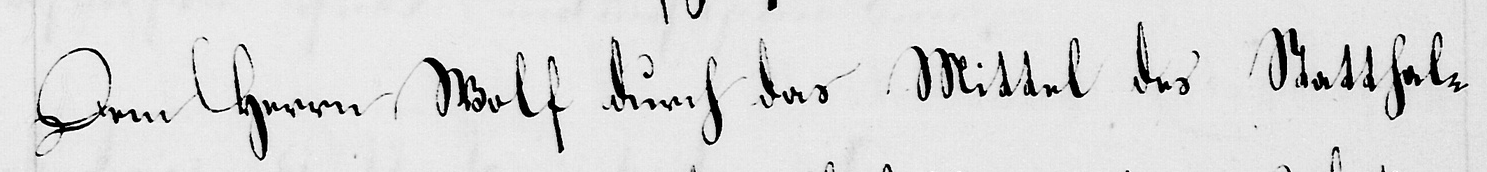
Dem Herrn Wolf durch das Mittel des Statthal¬
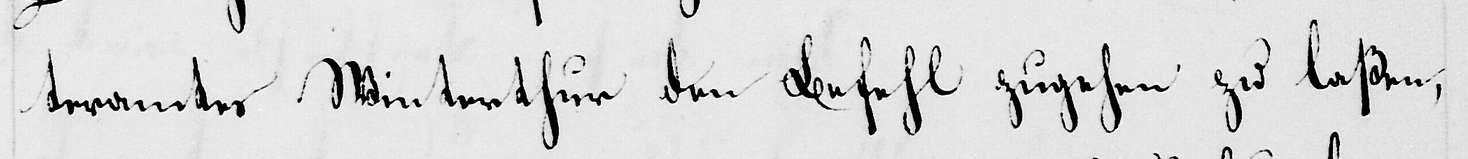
teramtes Winterthur den Befehl zugehen zu laßen,
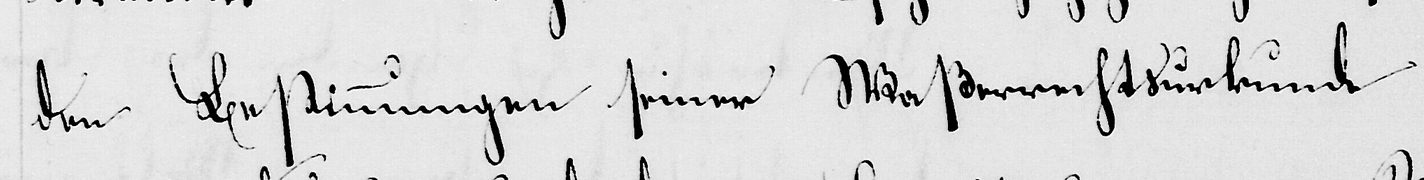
den Bestimmungen seiner Waßerrechtsurkunde
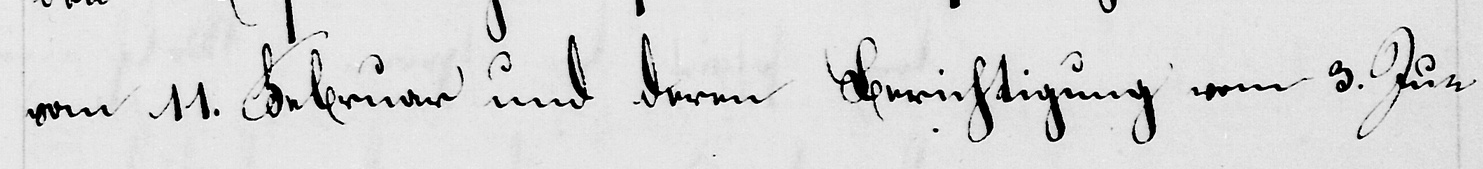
vom 11. Februar und deren Berichtigung vom 3. Ju-
